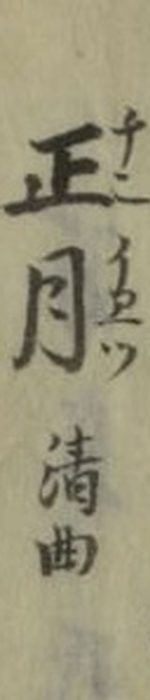正月清曲
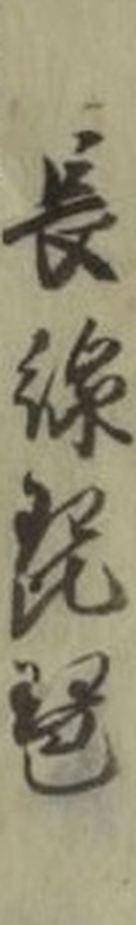長線琵琶
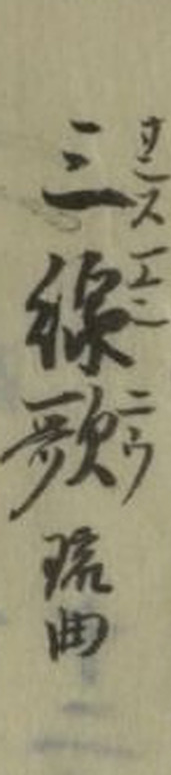三線歌琉曲
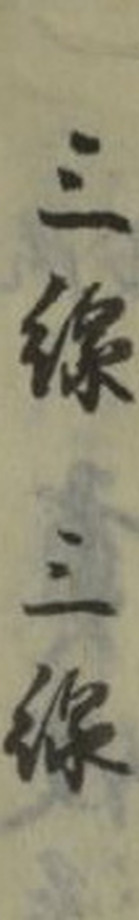三線三線

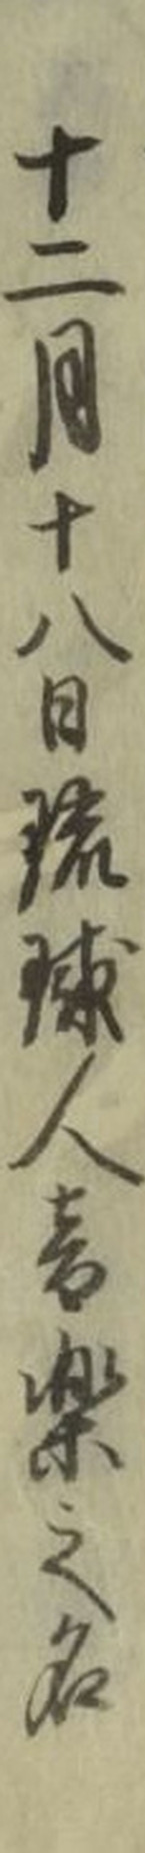十二月十八日琉球人音楽之名
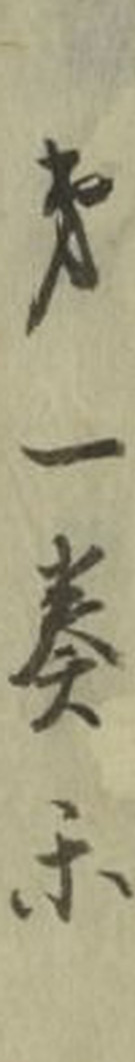第一奏楽
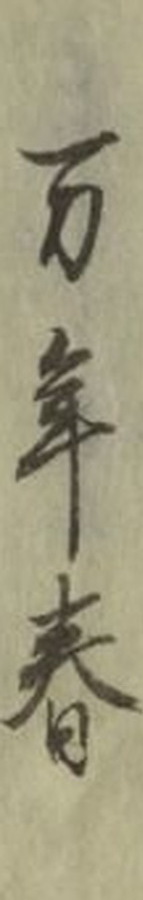万年春
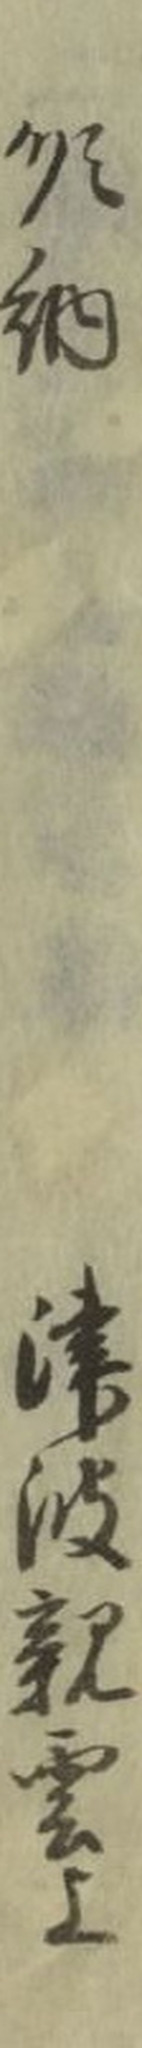順納津波親雲上
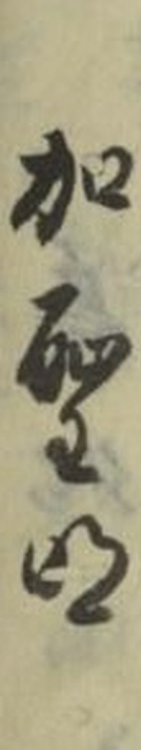加聖明
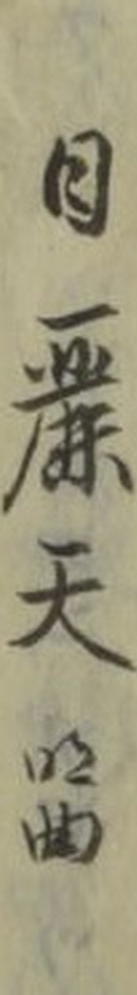日麗天明曲
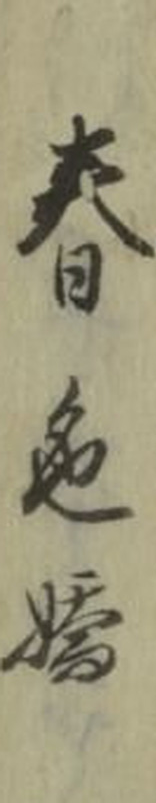春色嬌
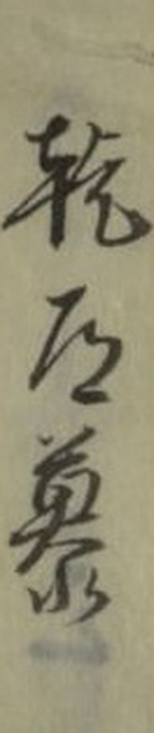乾道慕

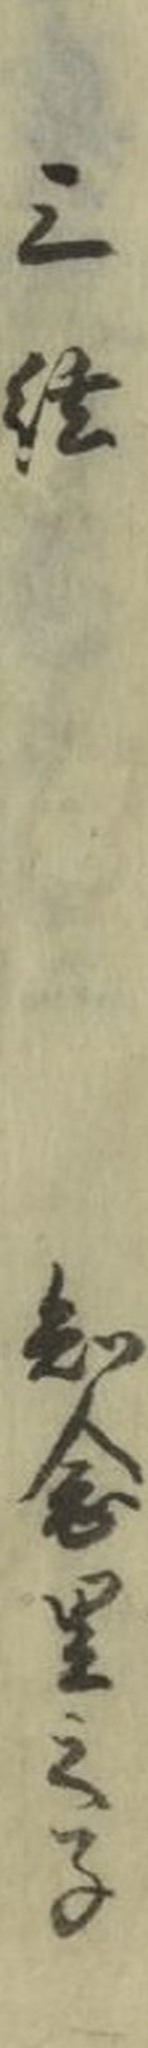三絃知念里之子
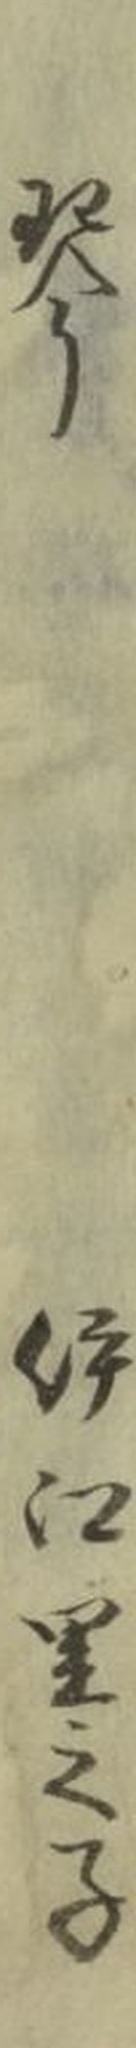琴伊江里之子
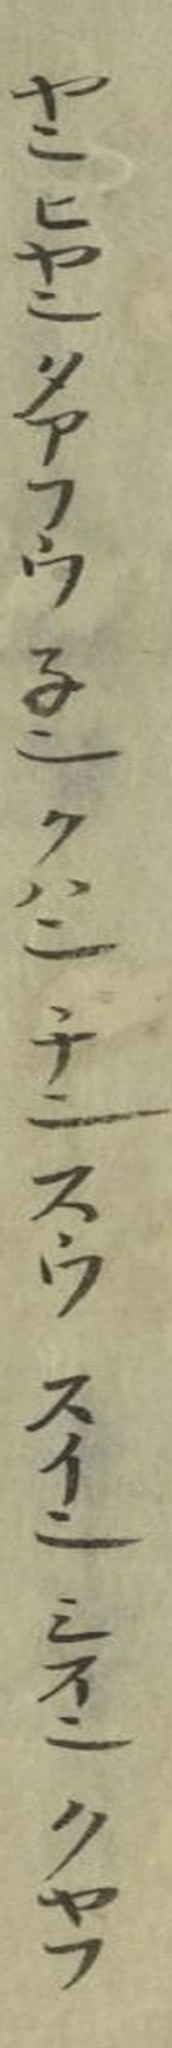ヤンヒヤンタアフウネンクハンチンスウスインシスンクヤフ
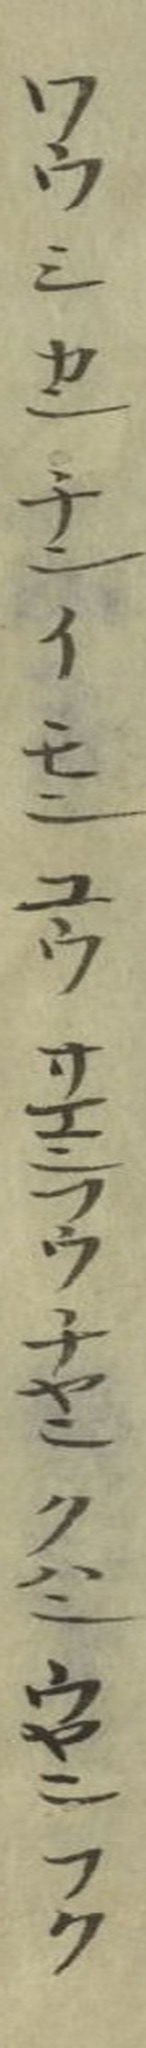ワウシカンチンイモンユウサエンフウチヤンクハンウヤンフク
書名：琉球人来朝之記
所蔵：University of the Ryukyus Library
